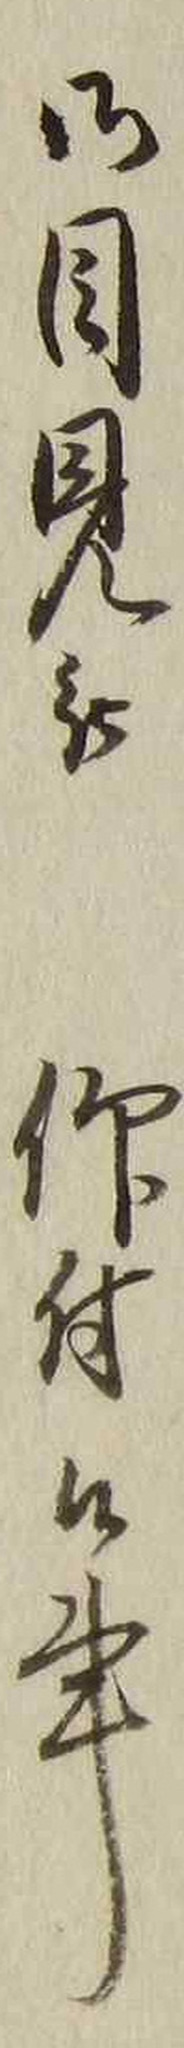御目見被仰付候事
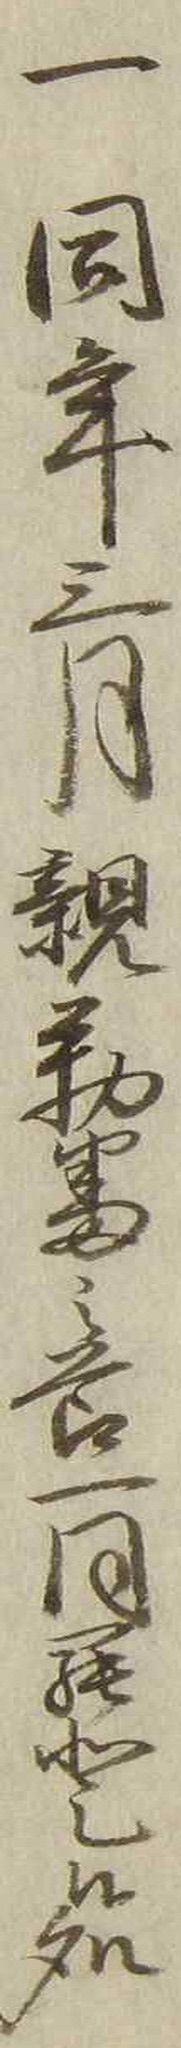一同年三月親勤番之節一同罷登候処

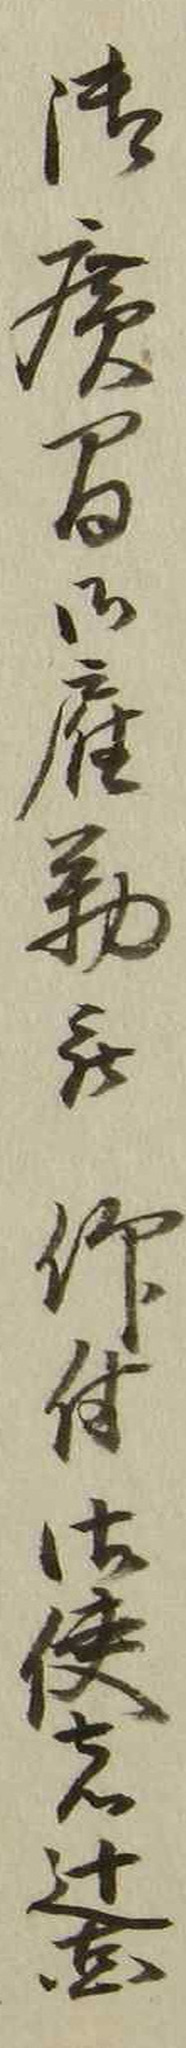御広間御雇勤被仰付御使者辻固
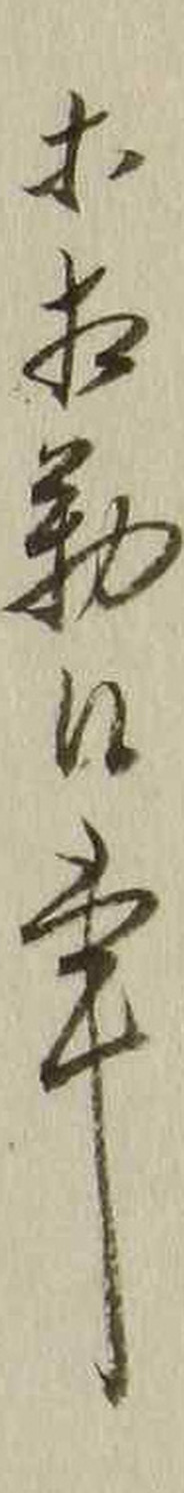等相勤候事
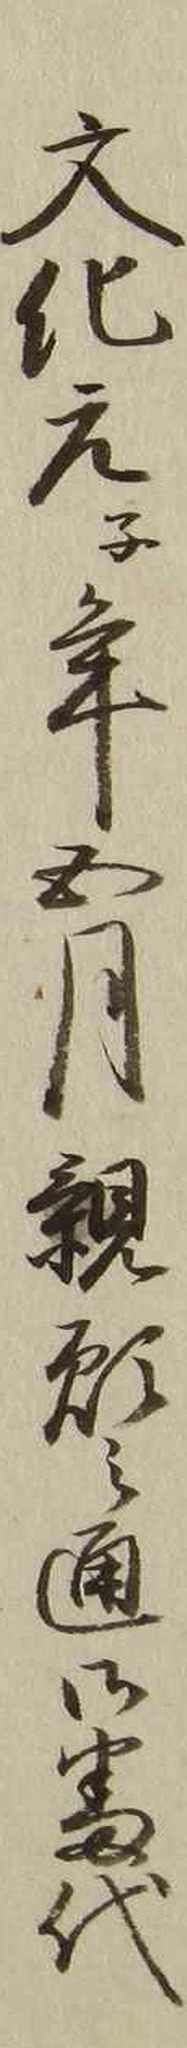一文化元子年五月親願之通御番代
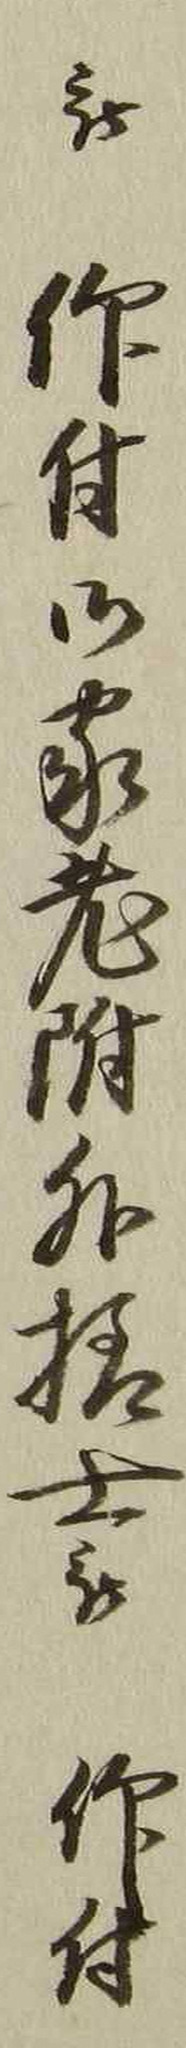被仰付御家老附外様士被仰付
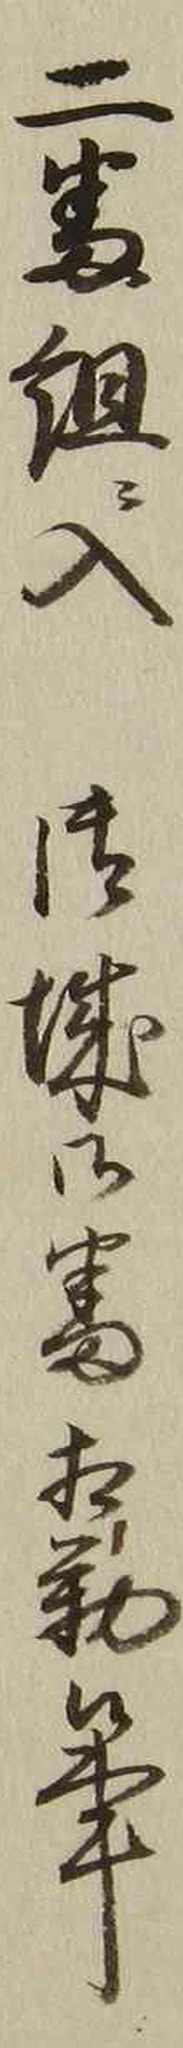二番組に入御城御番相勤候事
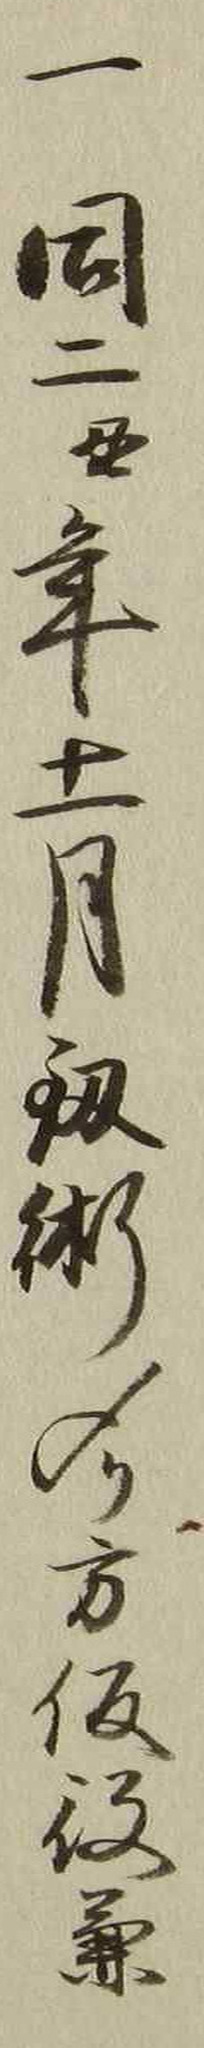一同二丑年十一月釼術〆り方仮役兼
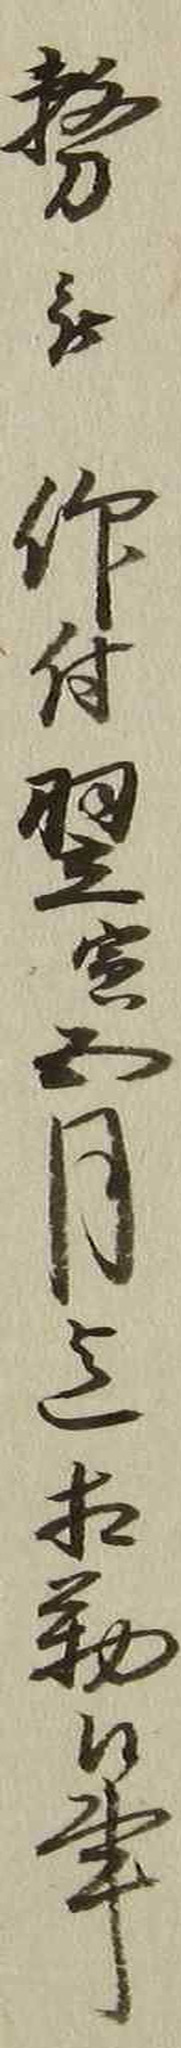務被仰付翌寅五月迄相勤候事
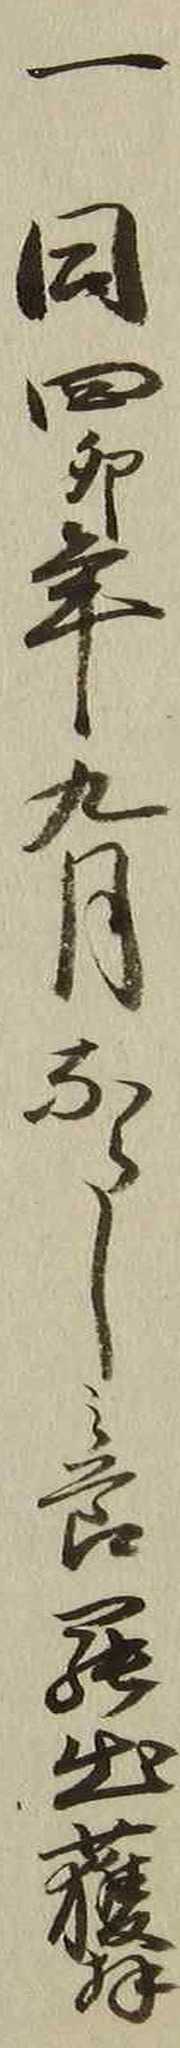一同四卯年九月なしら之節罷出獲拝
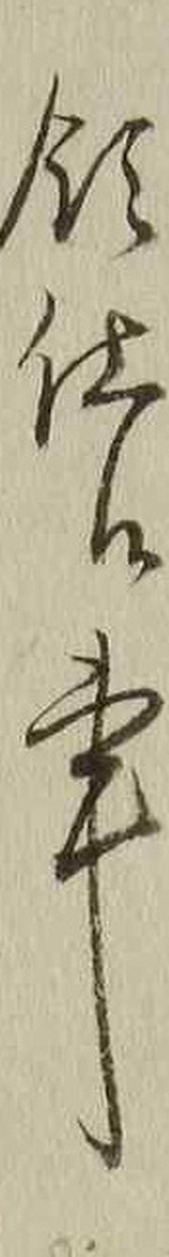領仕候事
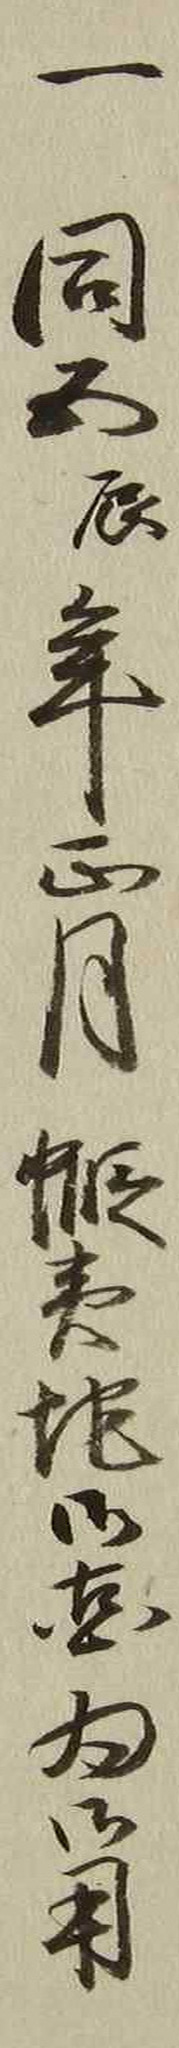一同五辰年正月蝦夷地御固為御用
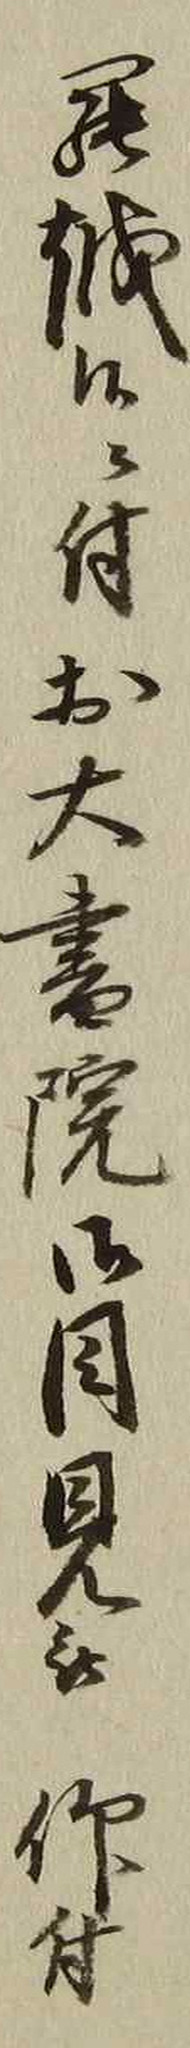罷越候に付於大書院御目見被仰付
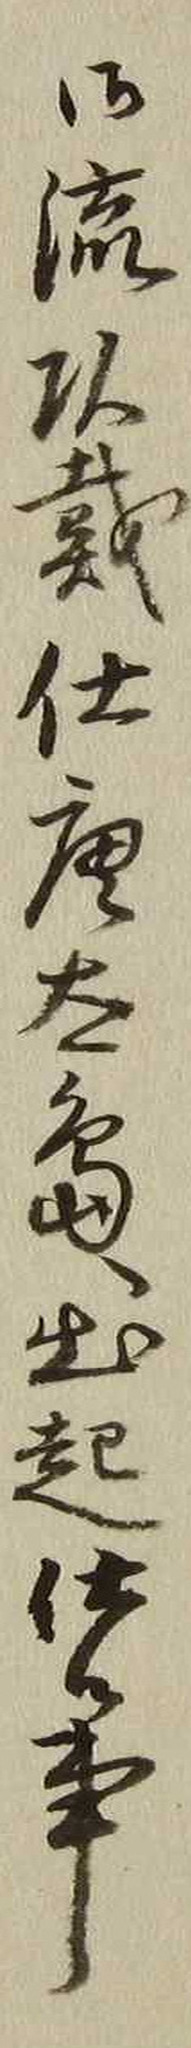御流頂戴仕唐太嶋へ出起仕候事
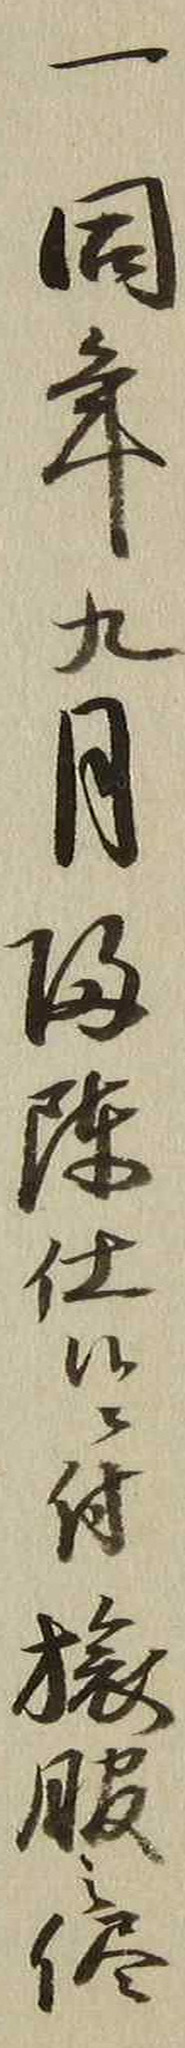一同年九月帰陣仕候に付旅服之侭
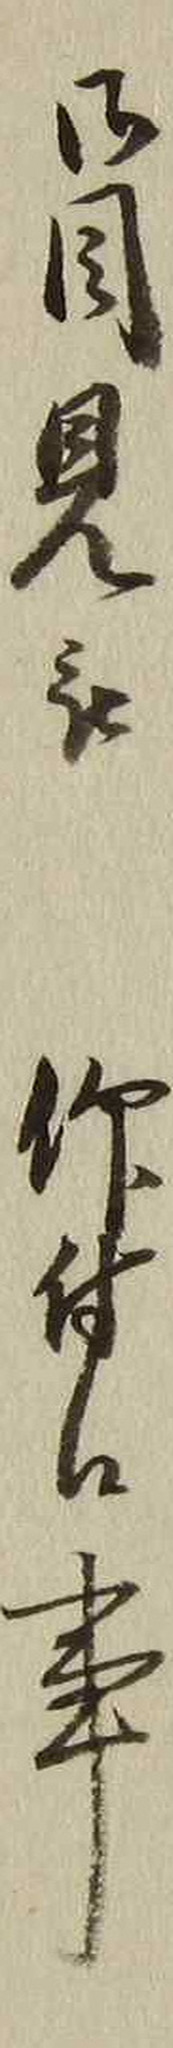御目見被仰付候事
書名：諸士系譜　巻之133　た之部9
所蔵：会津若松市立会津図書館
